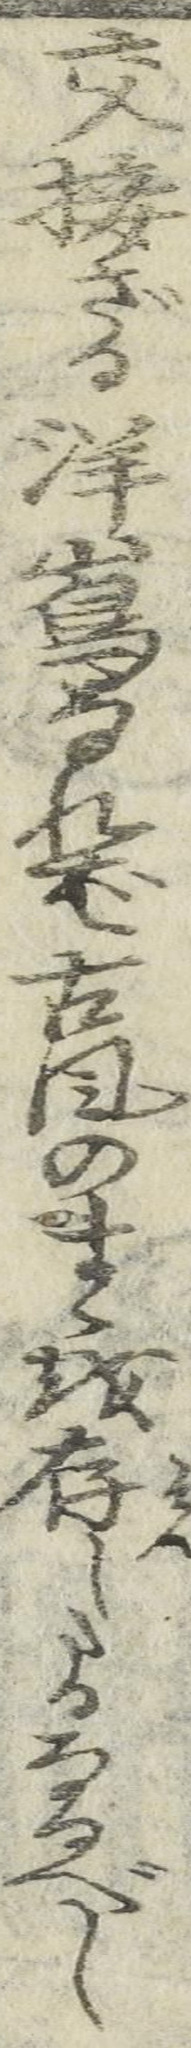交接ざる洋嶋なれば古風のまゝを存したるなるべし
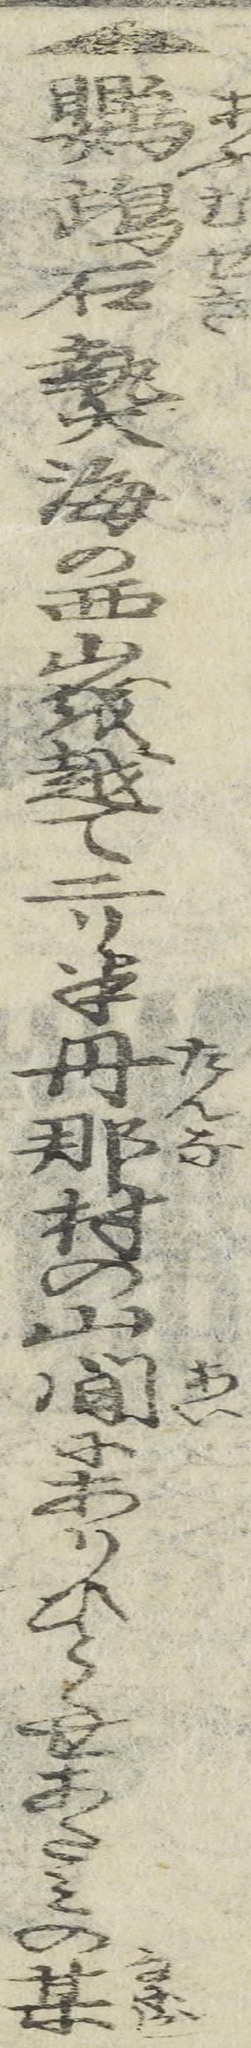▲鸚鵡石熱海の西山を越て二リ半丹那村の山間にありひとゝせあたみの某
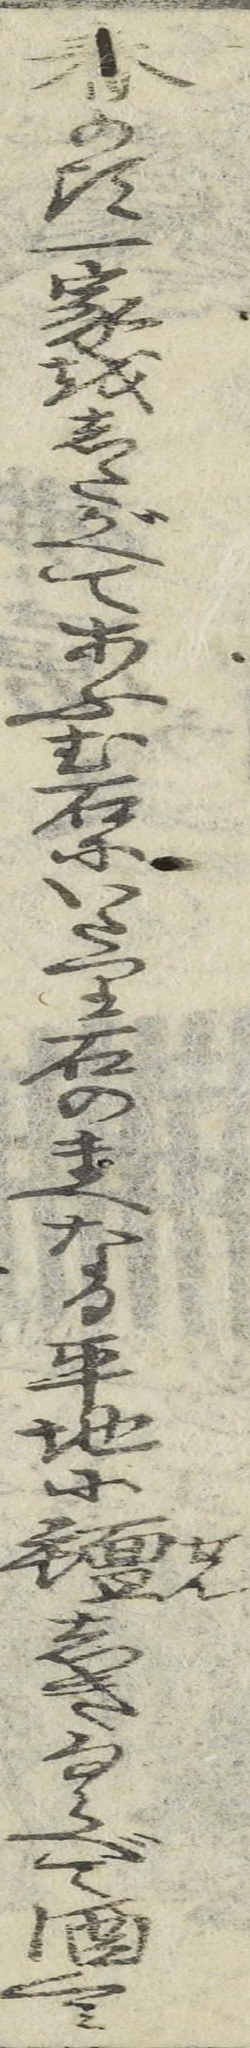春の頃一家をしたがへてあふむ石にいたり石のまへなる平地に氊しきならべて酒くみ
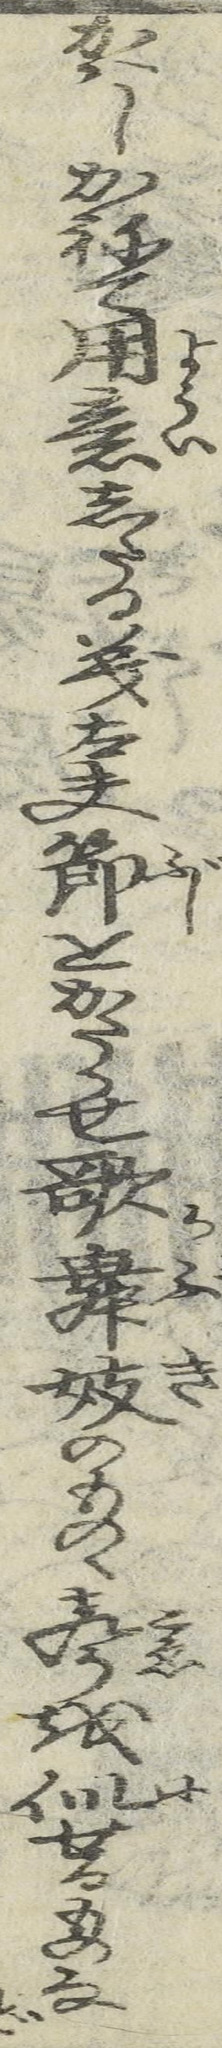かはしかねて用意したる義太夫節をかたらせ歌舞妓のものゝ声を似せるものなど
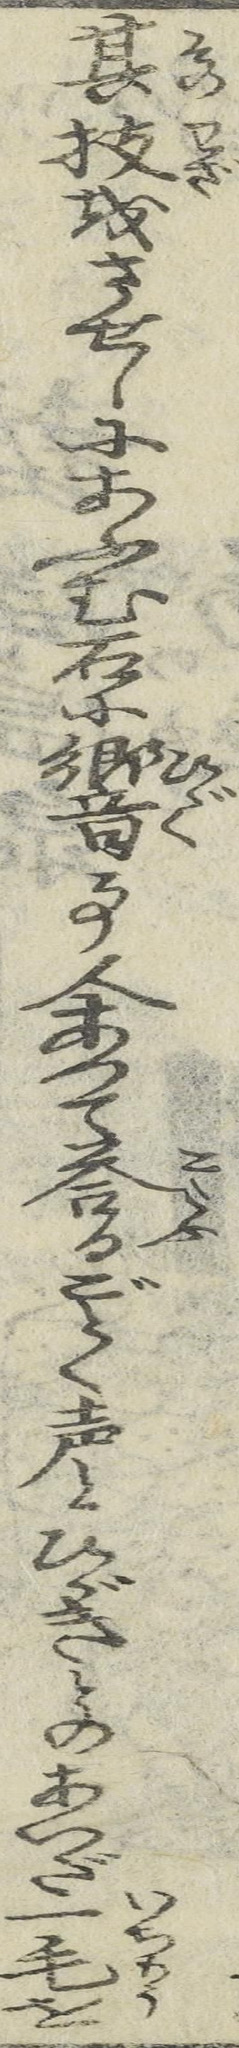其技をさせしにあふむ石に響事人あつて答るごとく声とひゞきとのあいだ一毛を
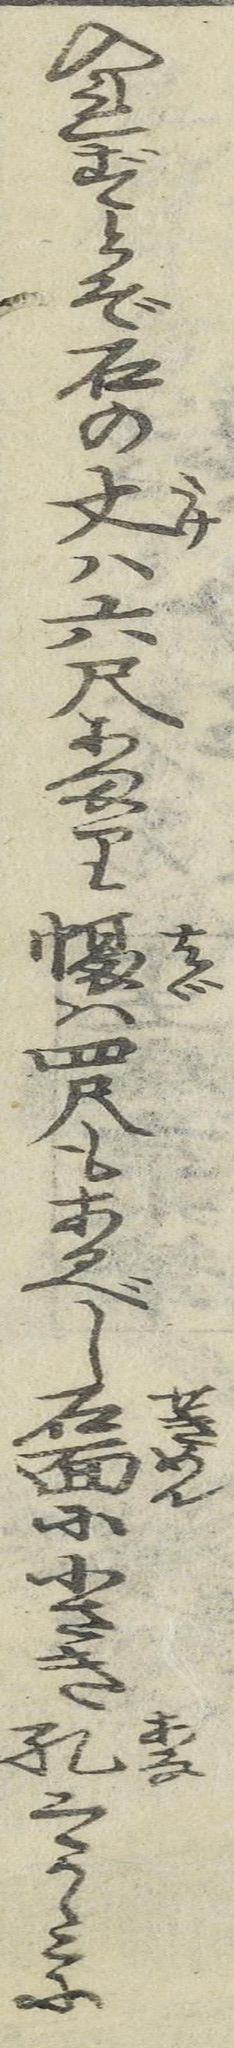入れずとぞ石の丈は六尺あまり幅は四尺もあるべし石面に小さき孔こゝかしこに

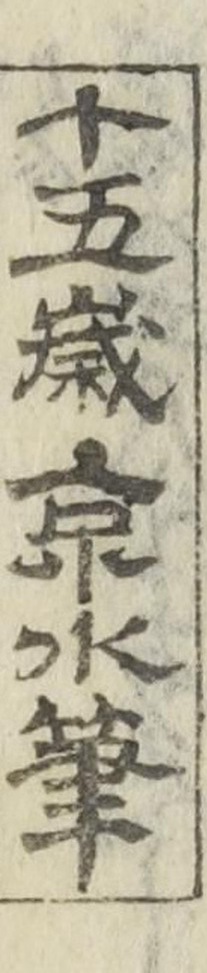十五才京水筆
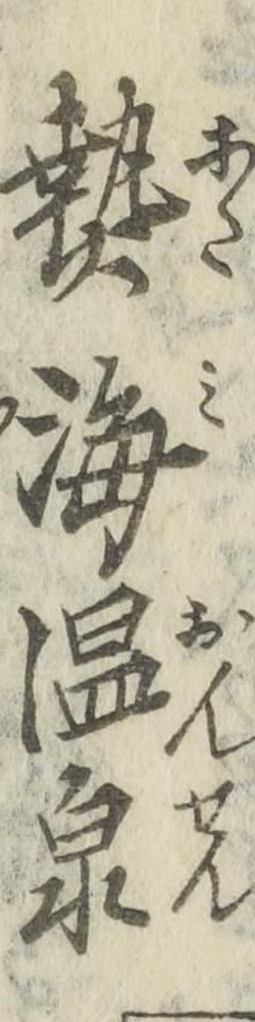熱海温泉
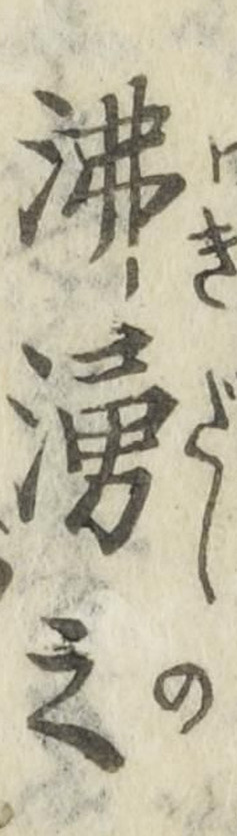沸湧之
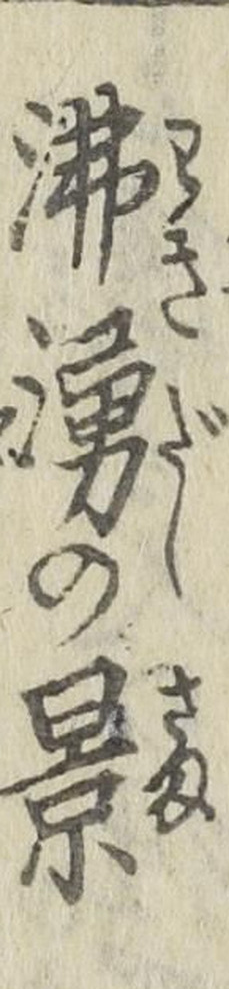沸湧の景
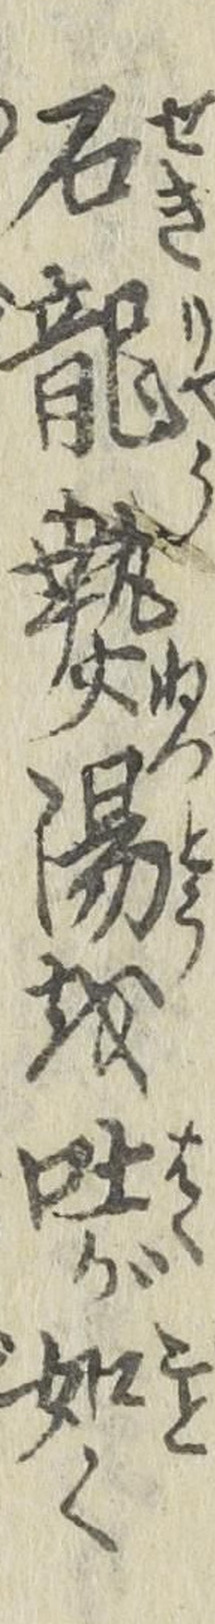石龍熱湯を吐が如く
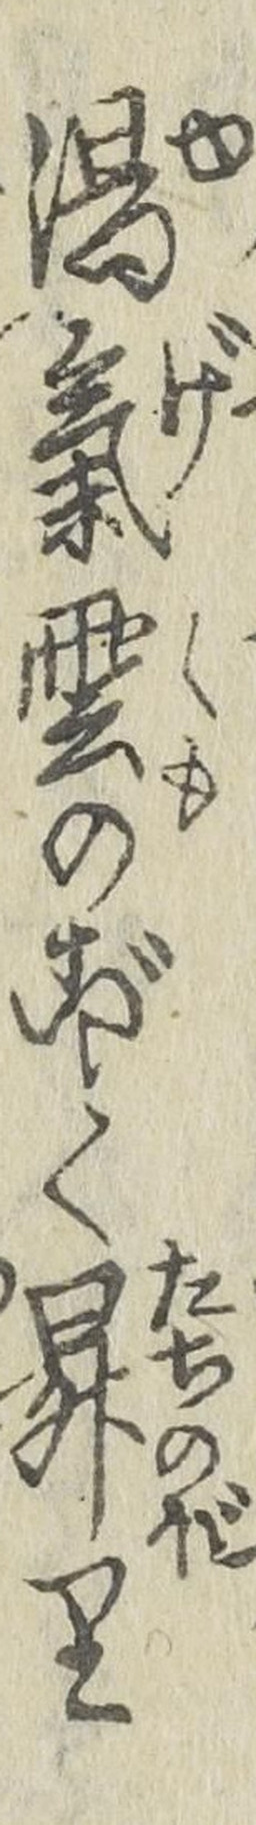湯氣雲のごとく昇り
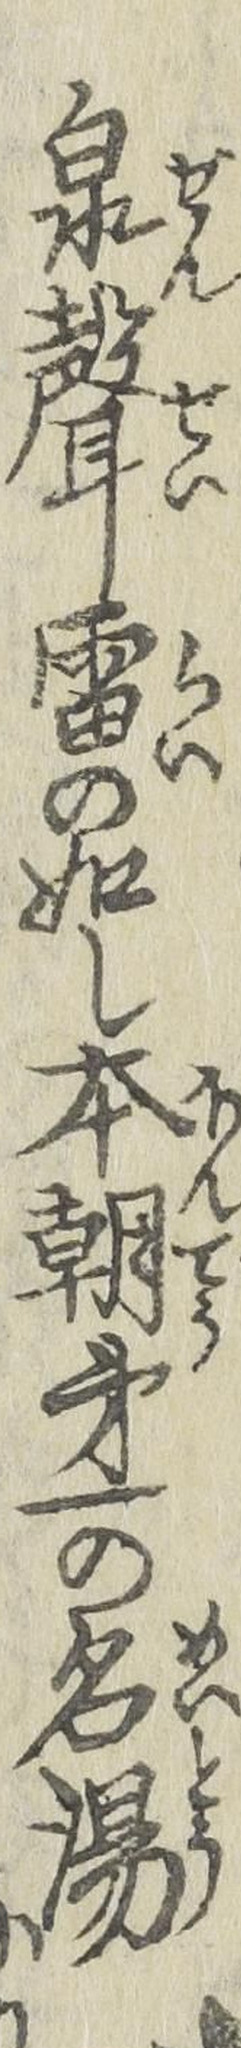泉聲雷の如し本朝第一の名湯

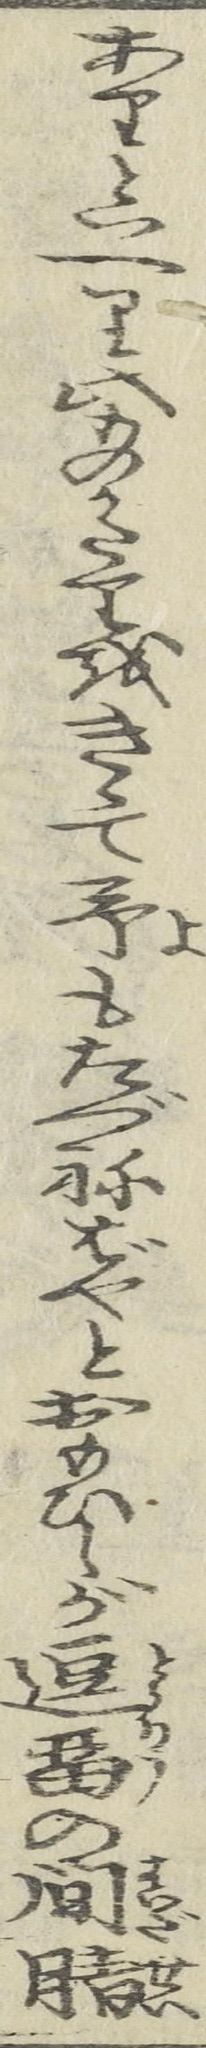ありといへり此ものかたりをきゝて予もたづねばやとおもひしが逗留の間晴
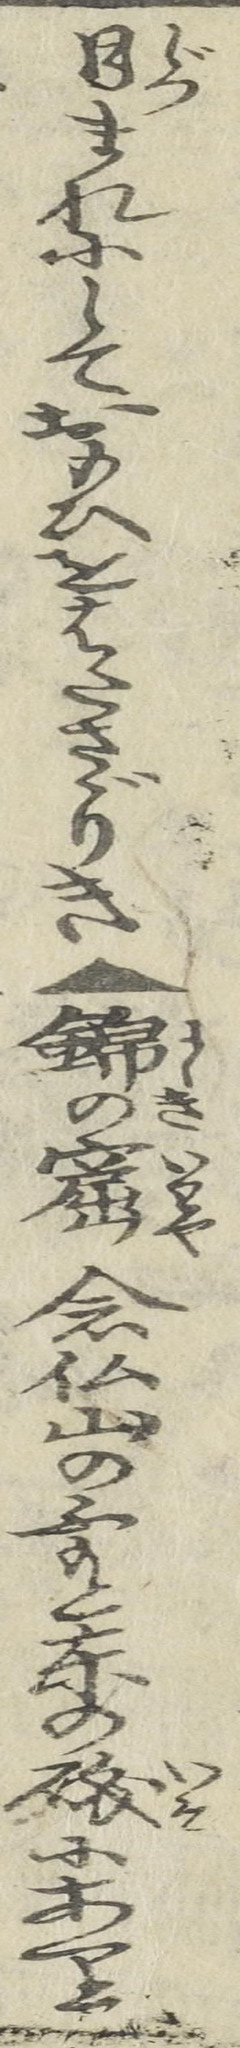日まれにしておもひをはたさゞりき▲錦の窟念仏山のふもと東の磯にあり
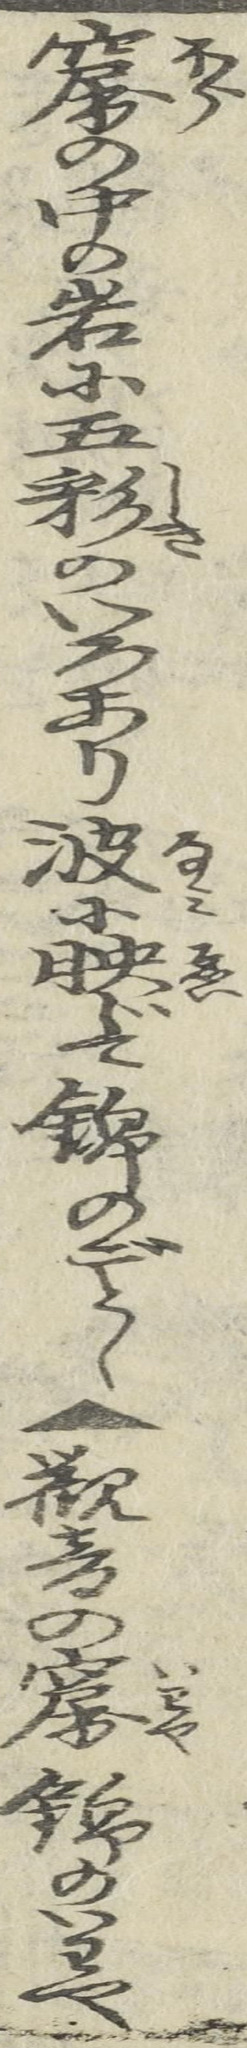窟の中の岩に五彩のいろあり波に映じて錦のごとし▲観音の窟錦のいわや
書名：熱海温泉圖彙
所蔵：東京大学地震研究所図書室 Earthquake Research Institute Library, The University of Tokyo, JAPAN
